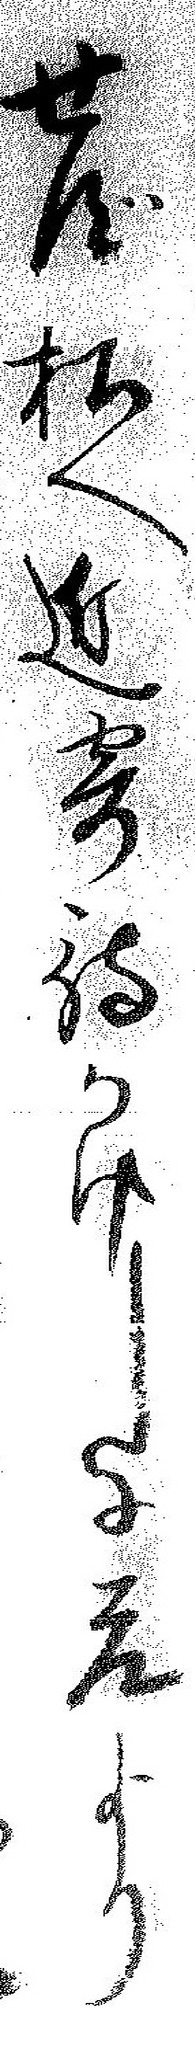せず松へ近寄待かけしに元より
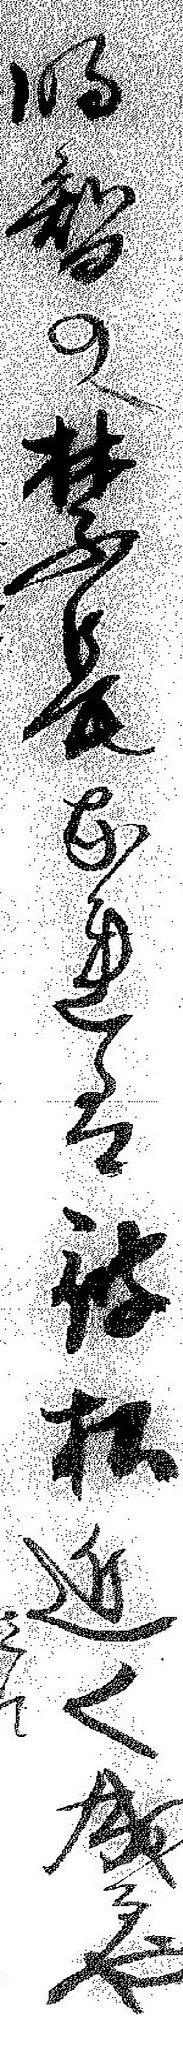明智の禁長なれは彼松近く成るや
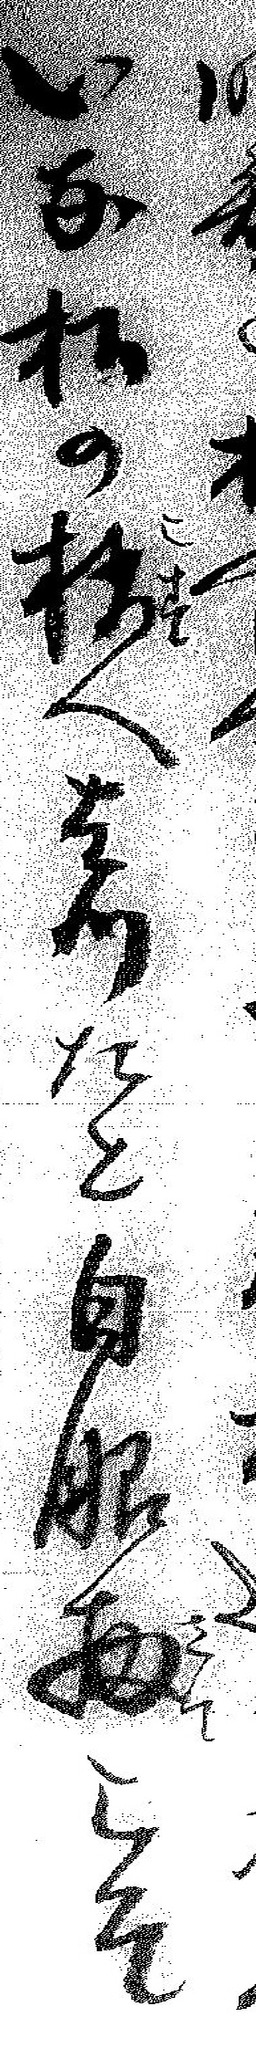いな松の梢へはつたと白眼扨こそ
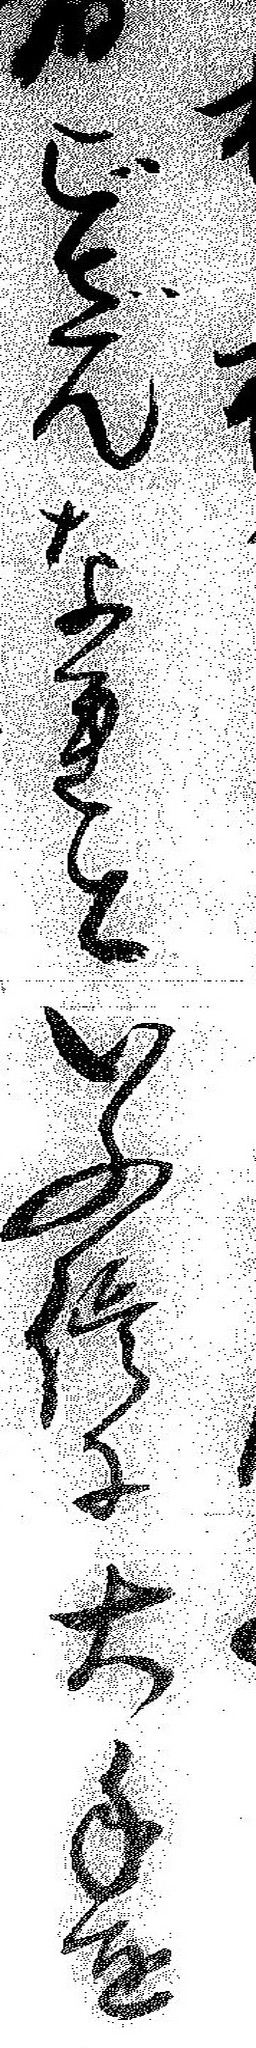曲者ござんなれといふ侭に大手を

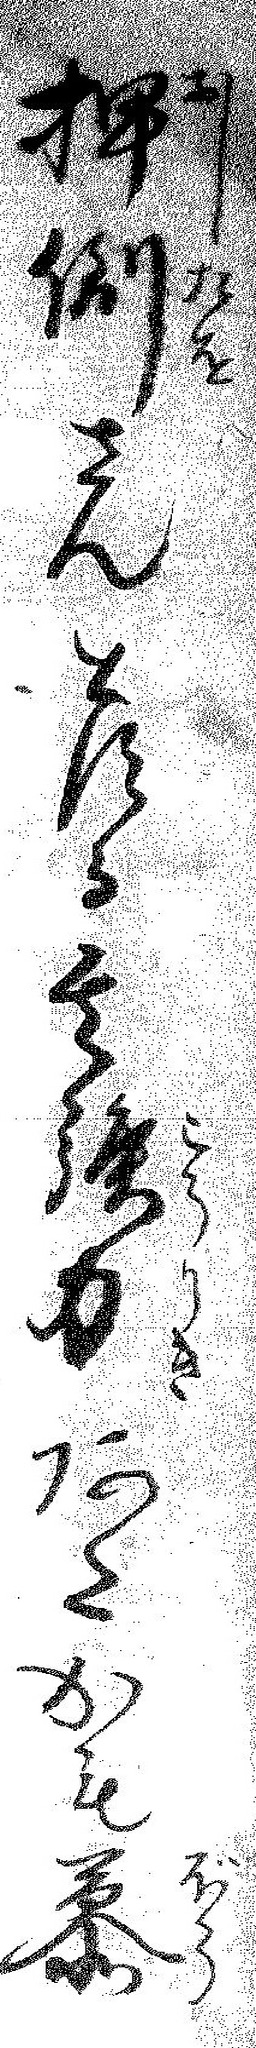押倒さんとする其強力あたかも暴
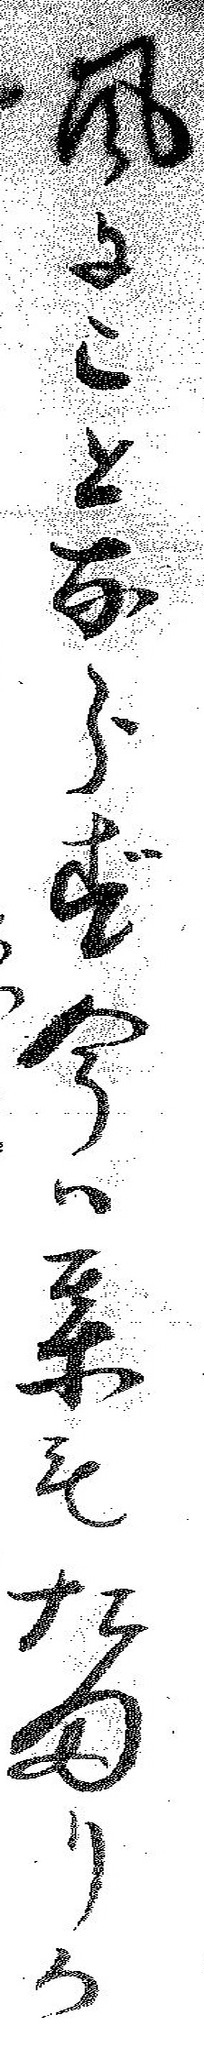風にことならず今は某もたまりか
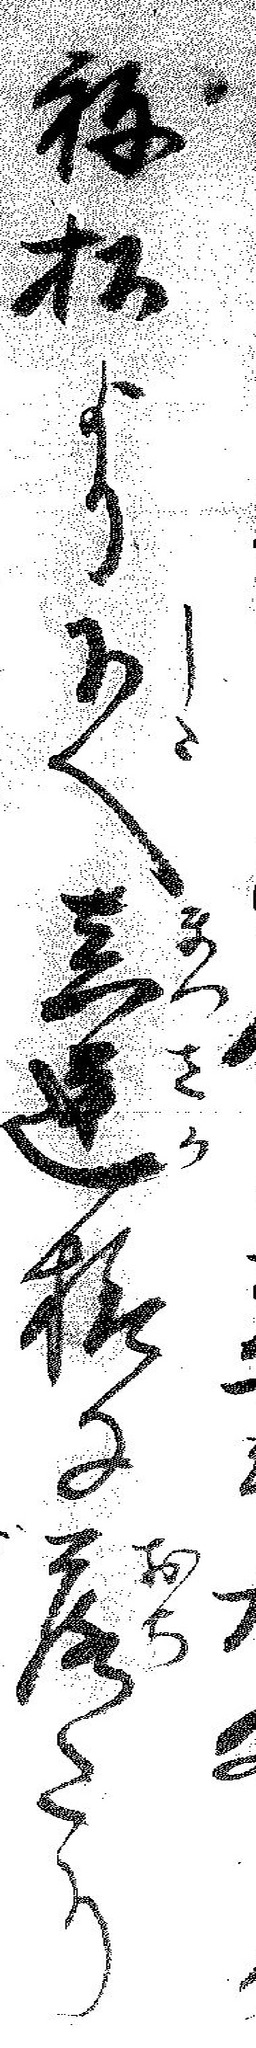ね松より下へ真逆様に落たり
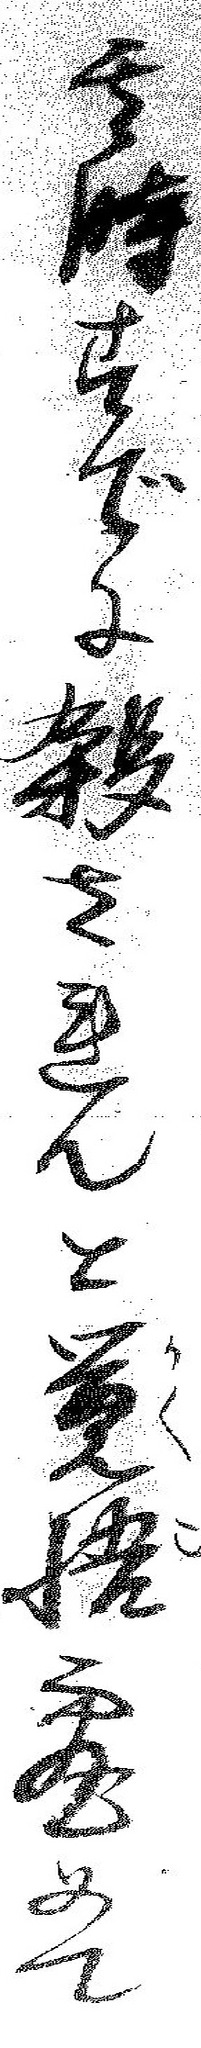其時すでに殺されんと覚悟究めて
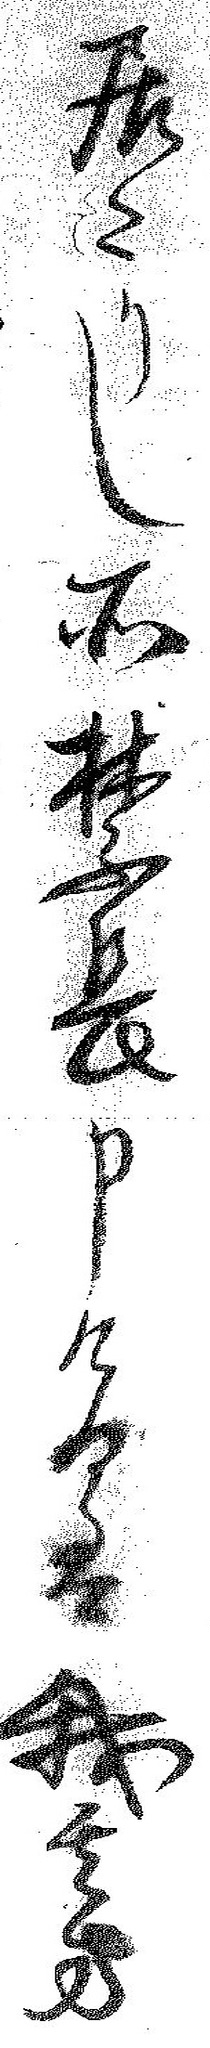居たりし所禁長申けるは我其方
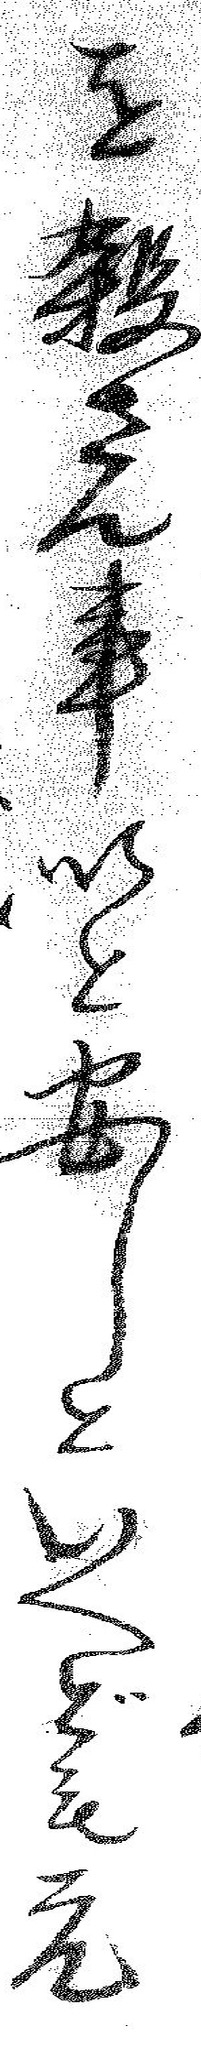を殺さん事いと安しといへども元
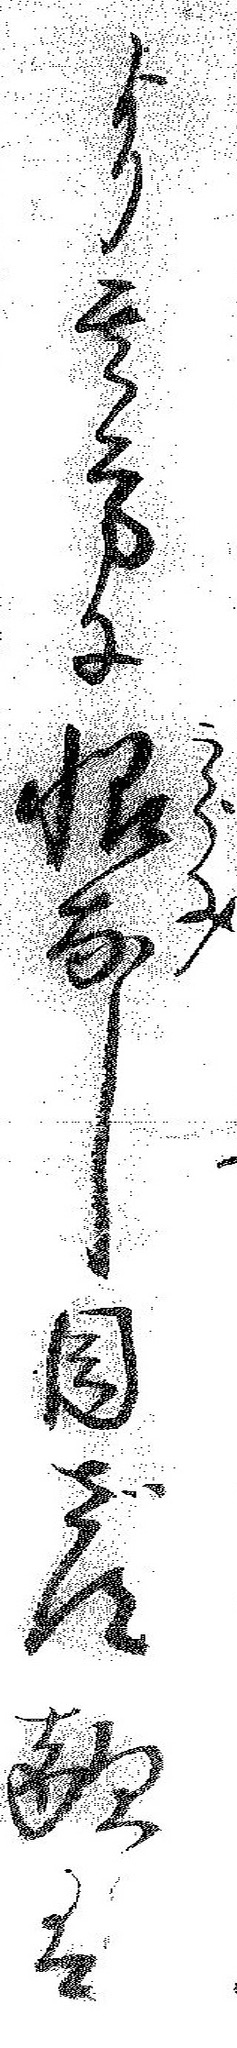より其方に恨なし目ざす敵は
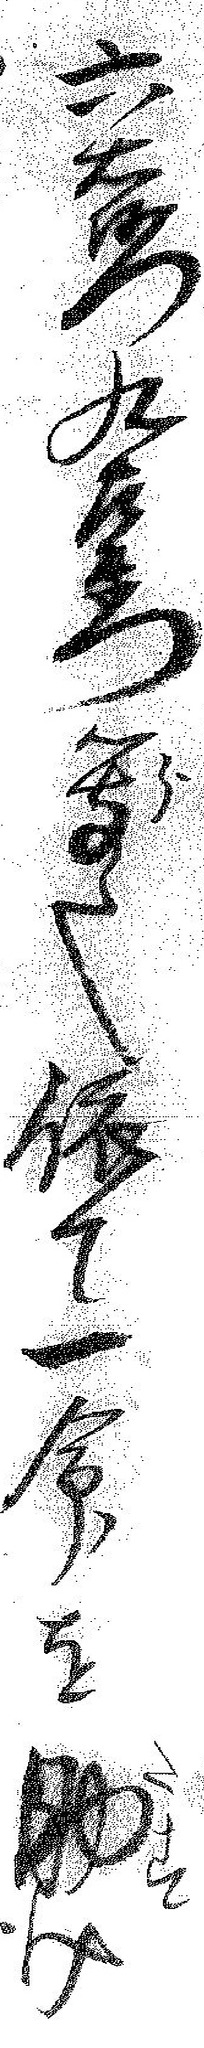六右衛門九左衛門等也依て一命を助け
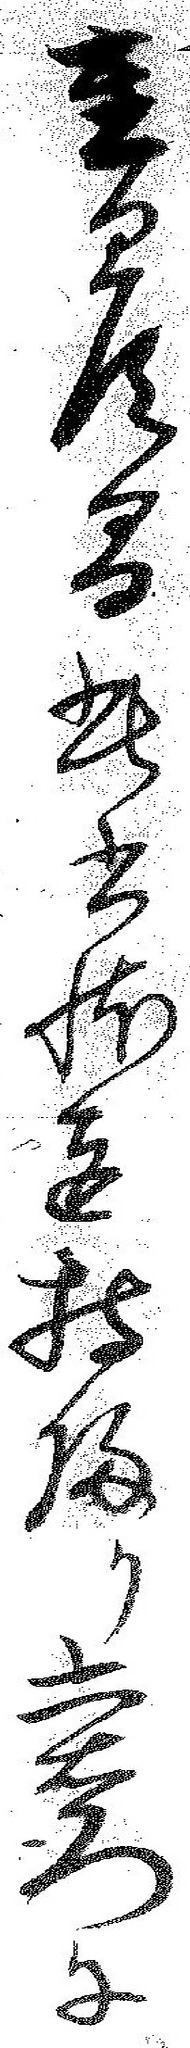遣わす間此書状を持帰り六右衛門に
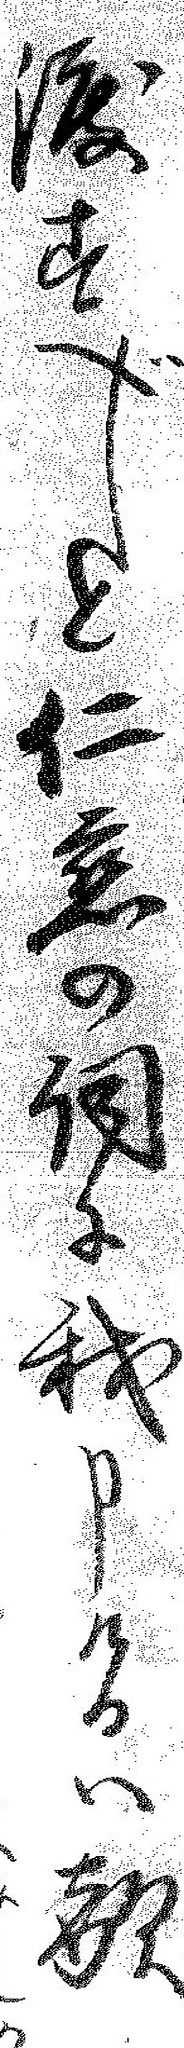渡すべしと仁慈の詞に我申けるは敵
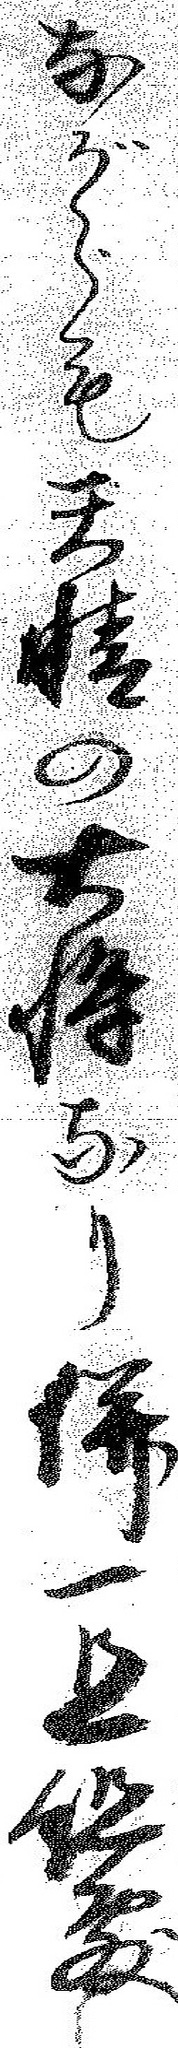ながらも天晴の大将なり併一旦組敷
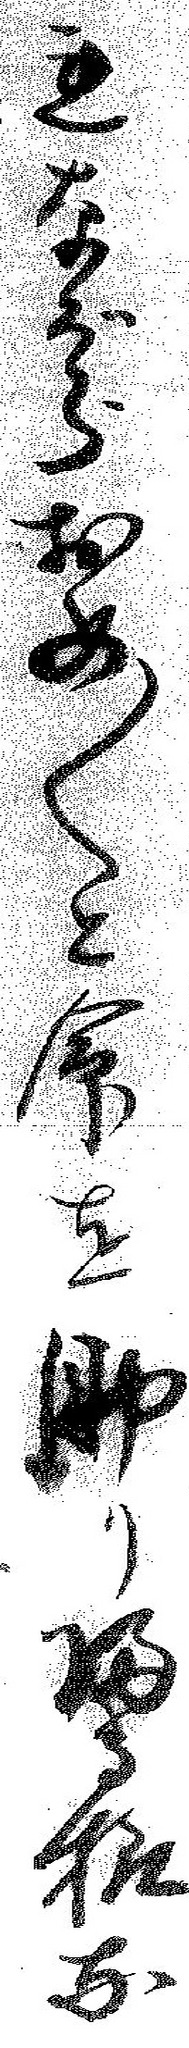れながらおめ〳〵と命を助り帰る様な
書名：近頃古狸珍説　礼義智信
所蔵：徳島県立図書館
